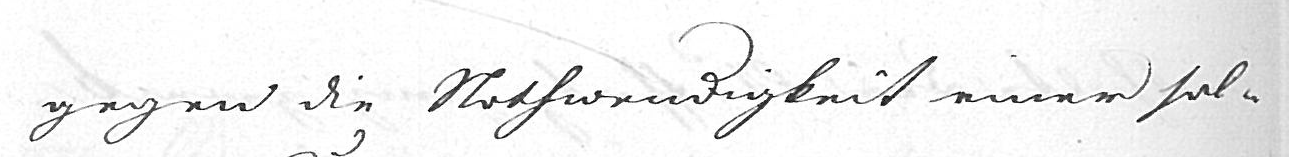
gegen die Nothwendigkeit einer sol-
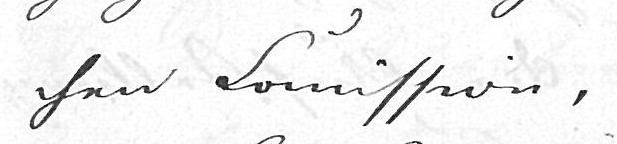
chen Commission.
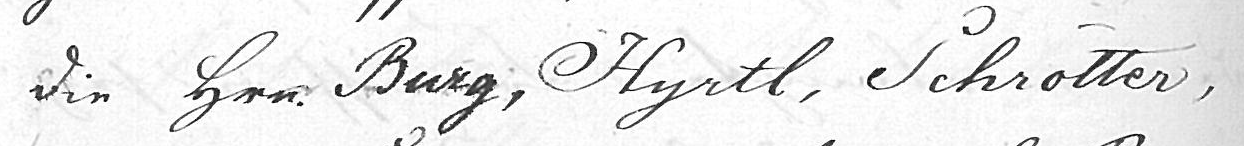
Die Hrn. Burg, Hyrtl, Schrötter,
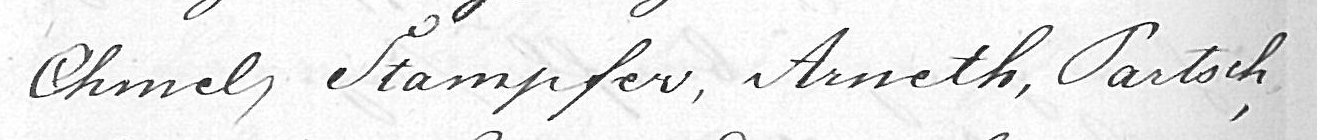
Chmel, Stampfer, Arneth, Partsch,
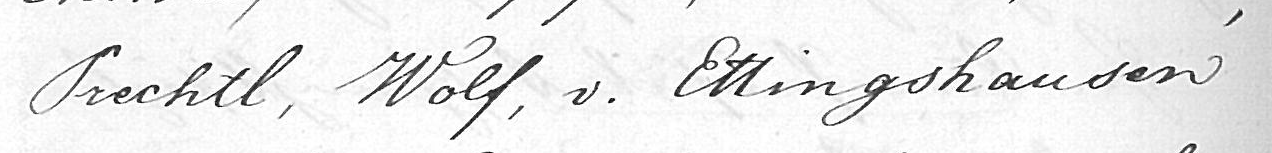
Prechtl, Wolf, v. Ettingshausen
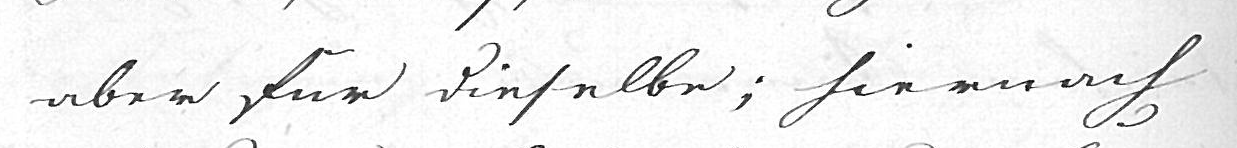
aber für dieselbe; hiernach
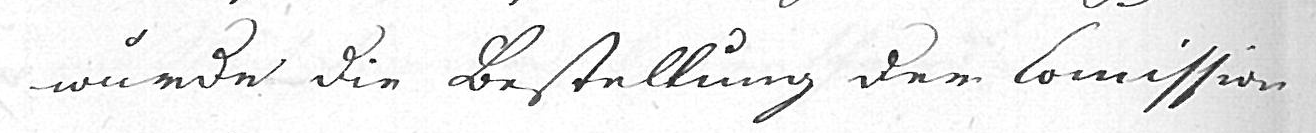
wurde die Bestellung der Commission
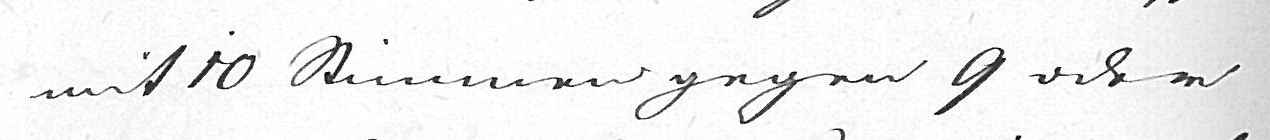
mit 10 Stimmen gegen 9 oder
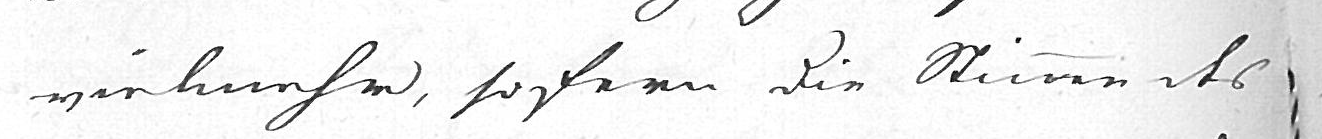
vielmehr, sofern die Stimme des-
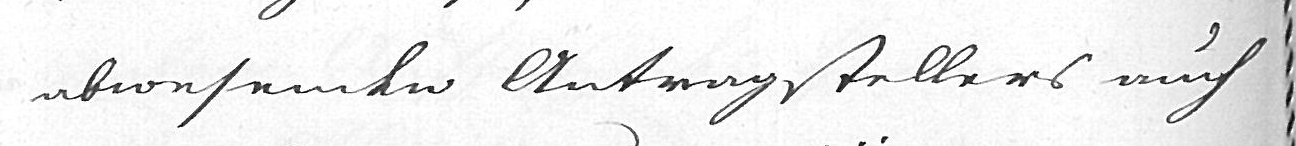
anwesenden Antragstellers auch
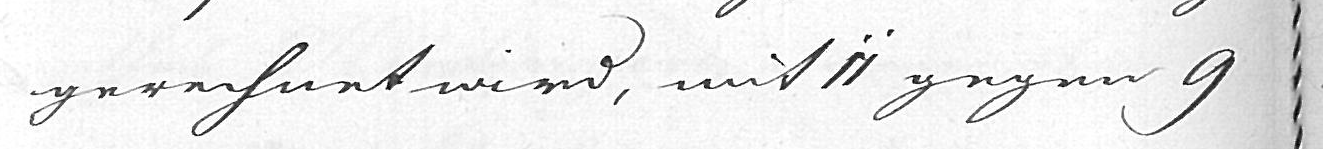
gerechnet wird, mit 11 gegen 9
